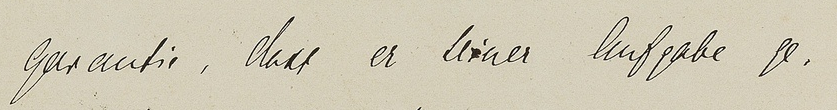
Garantie, dass er seiner Aufgabe ge-
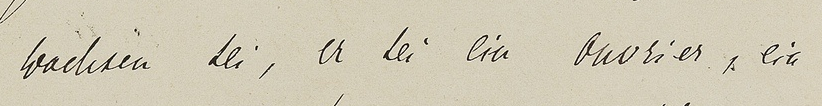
wachsen sei, er sei ein ouvrier, ein
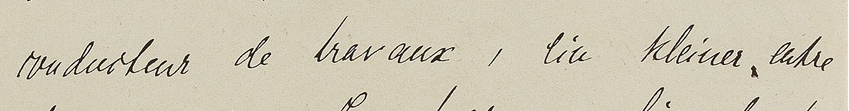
conducteur de travaux, ein kleiner entre-
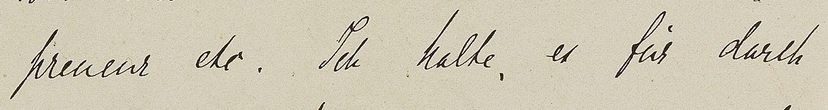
preneur etc. Ich halte es für durch-
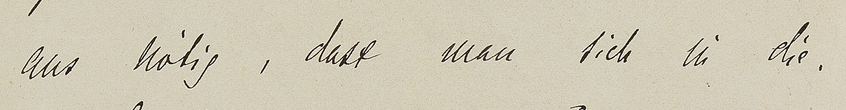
aus nötig, dass man sich in die-
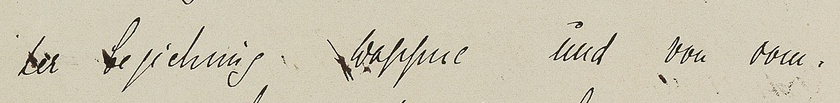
ser Beziehung wappne und von com-
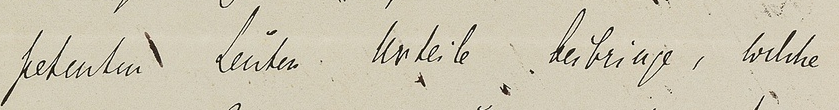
petenten Leuten Urteile beibringe, welche
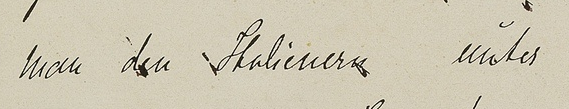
man den Italienern unter die
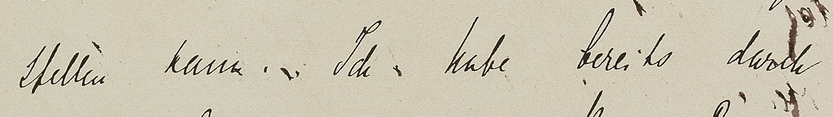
stellen kann. Ich habe bereits durch
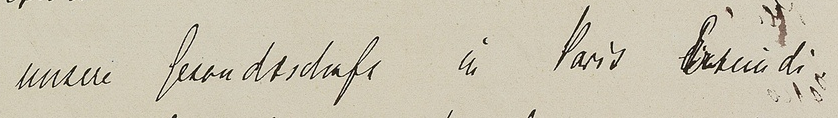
unsere Gesandtschaft in Paris Erkundi-
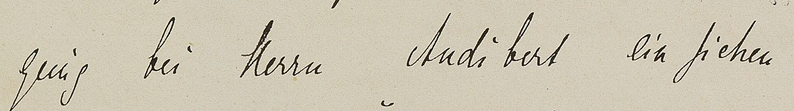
gung bei Herrn Audibert einziehen
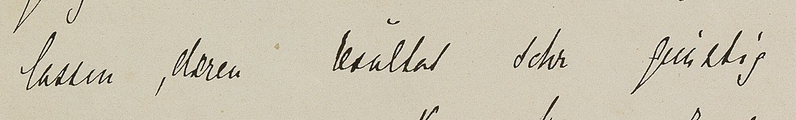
lassen, deren Resultat sehr günstig
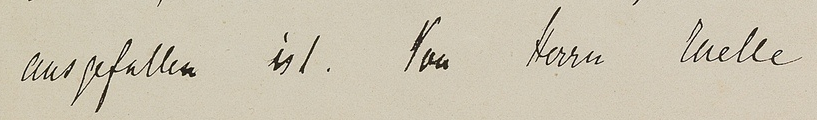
ausgefallen ist. Von Herrn Ruelle
